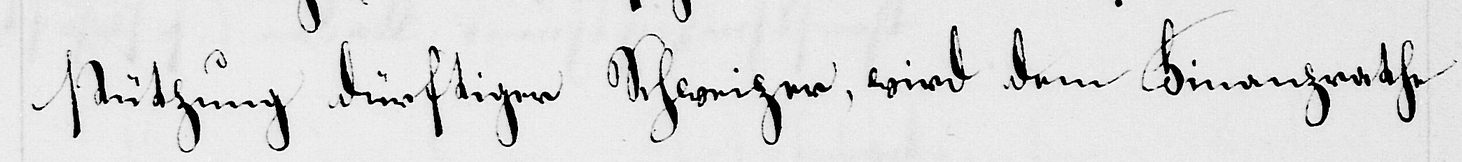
stützung dürftiger Schweizer, wird dem Finanzrathe
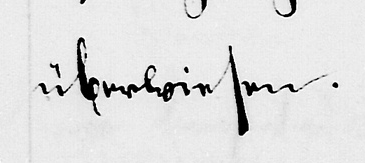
überwiesen.
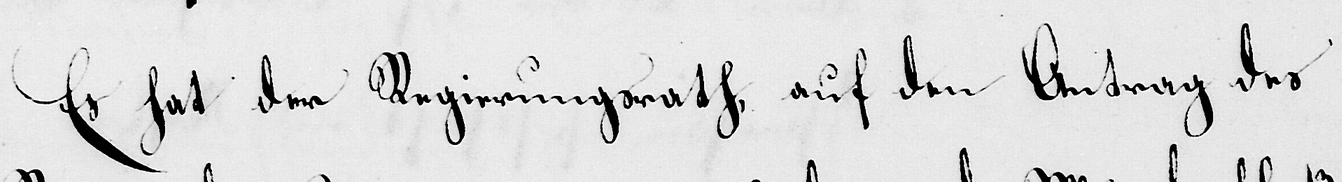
Es hat der Regierungsrath auf den Antrag des
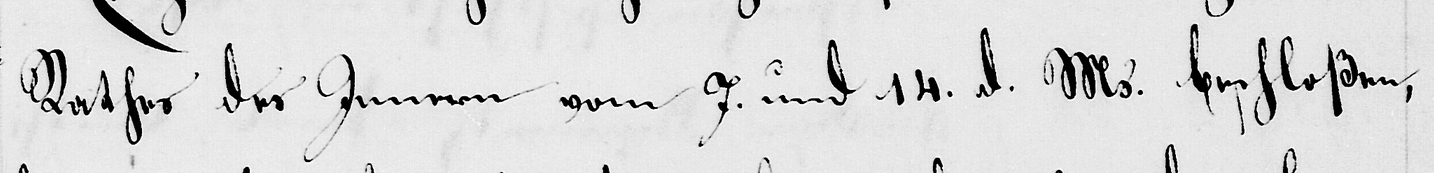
Rathes des Innern vom 7. und 14. d. Ms. beschloßen,
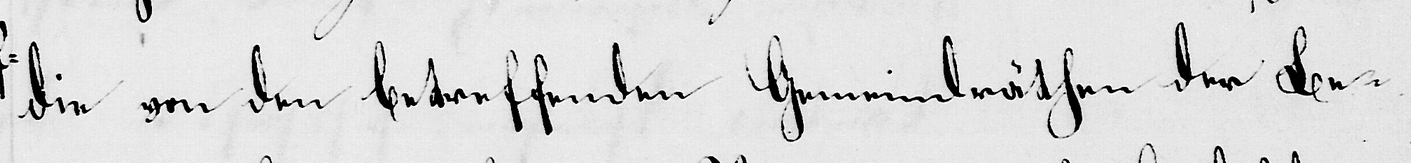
die von den betreffenden Gemeindräthen der Be¬
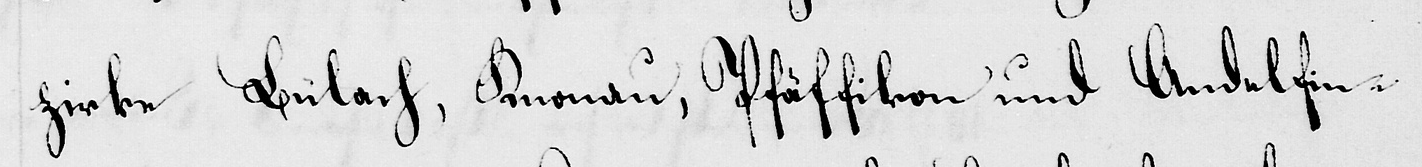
zirke Bülach, Knonau, Pfäffikon und Andelfin¬
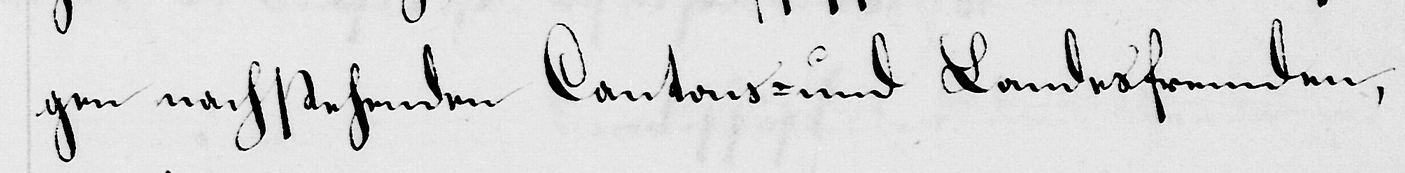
gen nachstehenden Cantons- und Landesfremden,
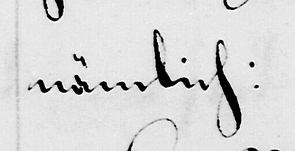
nämlich:
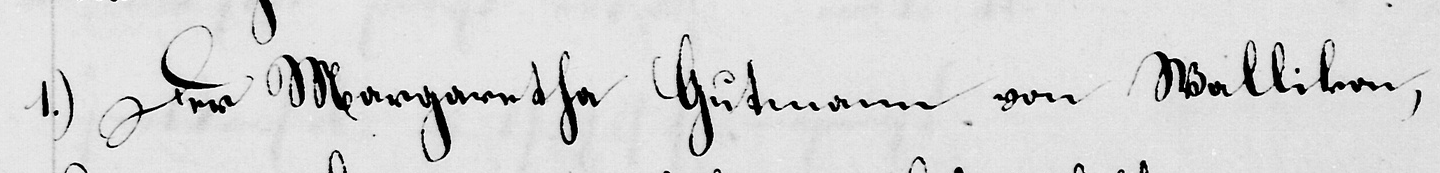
1.) Der Margaretha Gutmann von Wallikon,
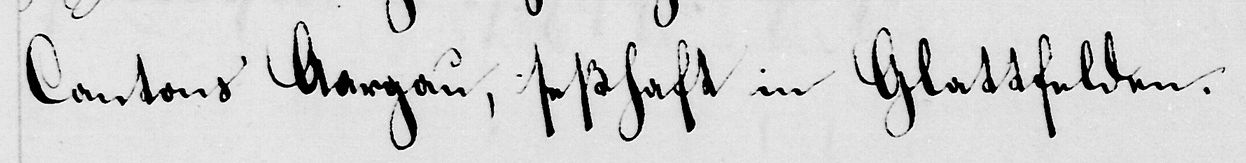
Cantons Aargau, seßhaft in Glattfelden.
